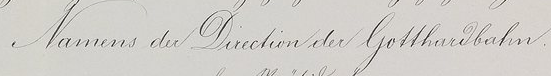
Namens der Direction der Gotthardbahn.
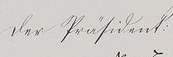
der Präsident:
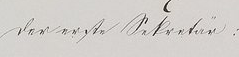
der erste Sekretär:
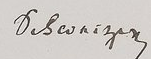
Schweizer
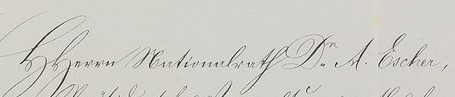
HHerrn Nationalrath Dr A. Escher,
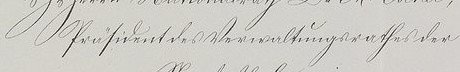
Präsident des Verwaltungsrathes der
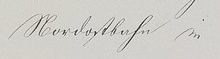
Nordostbahn in
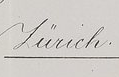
Zürich.
